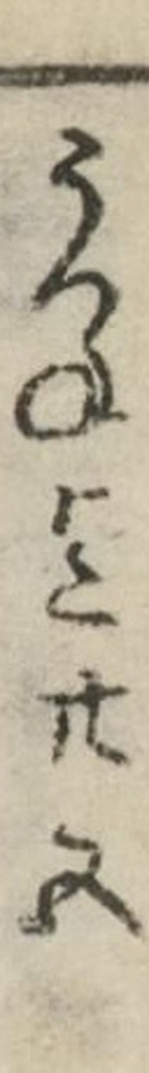うつね迄廿五
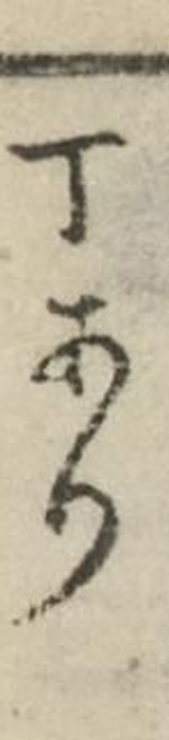丁あり

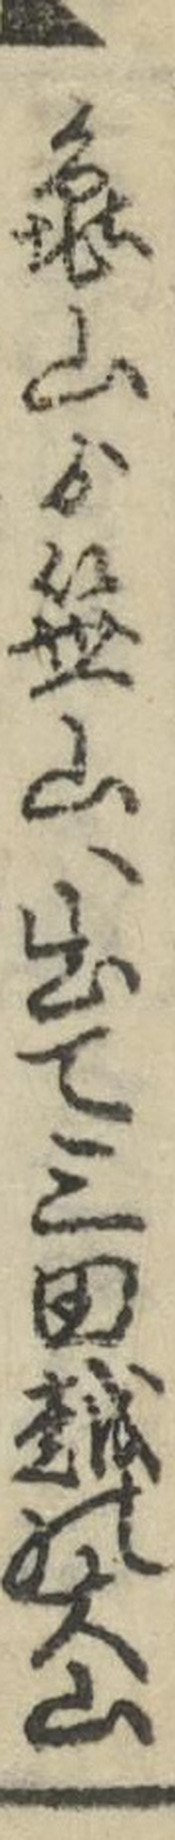▲亀山ゟ笹山へ出て三田越の大山
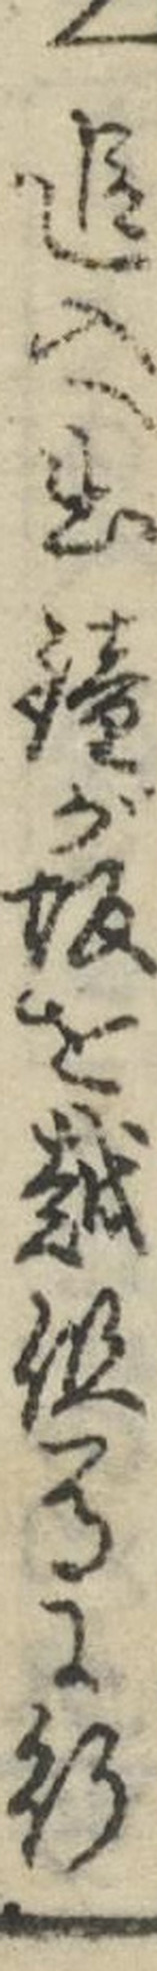追入へ出鐘が坂を越但馬に行
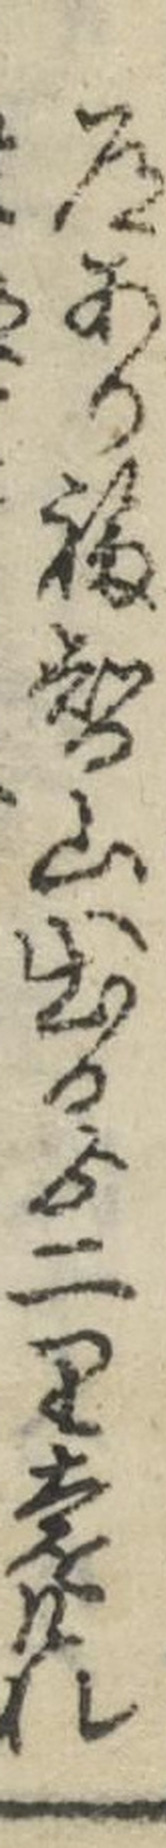道あり福智山へ出るゟ二里遠けれ
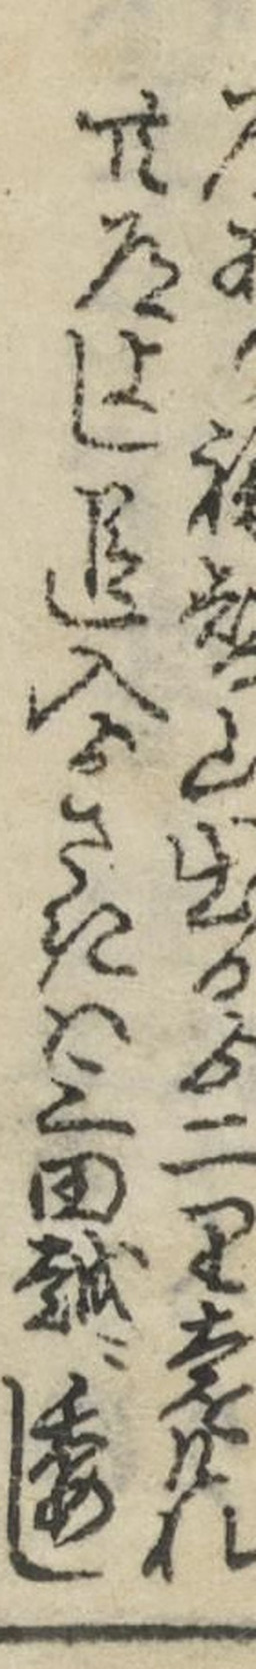共道よし追入ゟさきは三田越に委し
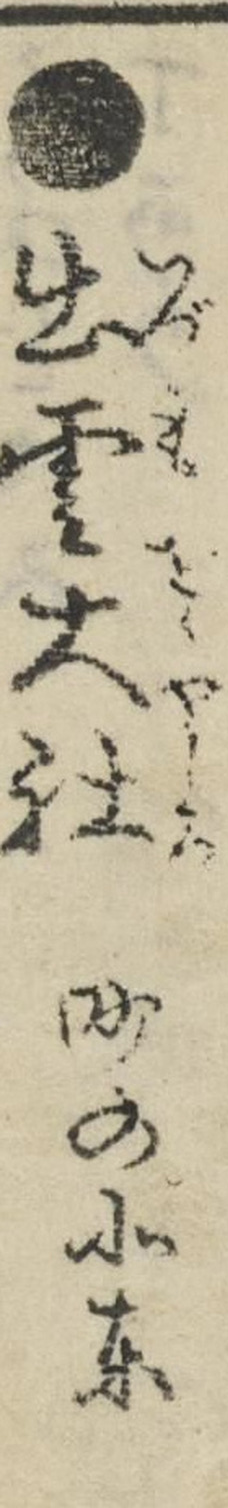●出雲大社町の北東
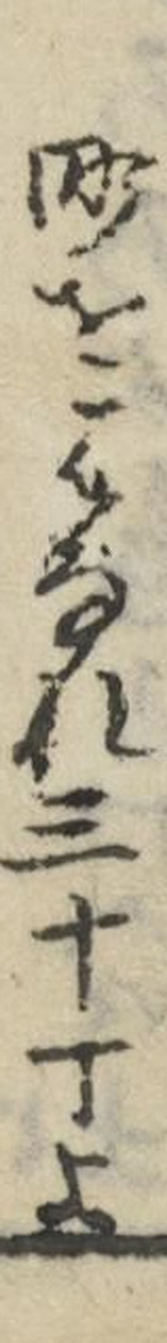町をはなれ三十丁よ
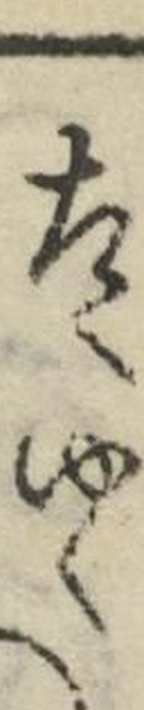左へゆく
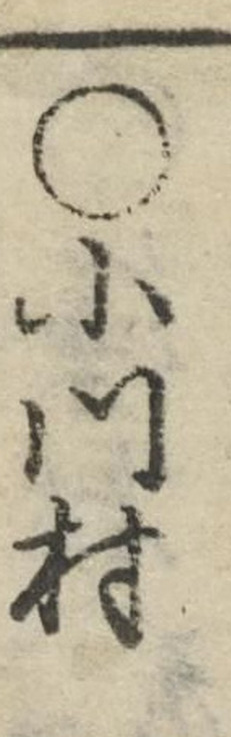〇小川村
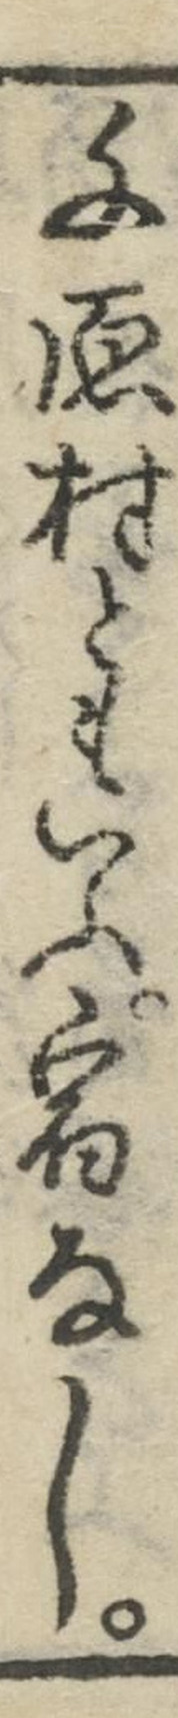千原村ともいふ。宿なし。
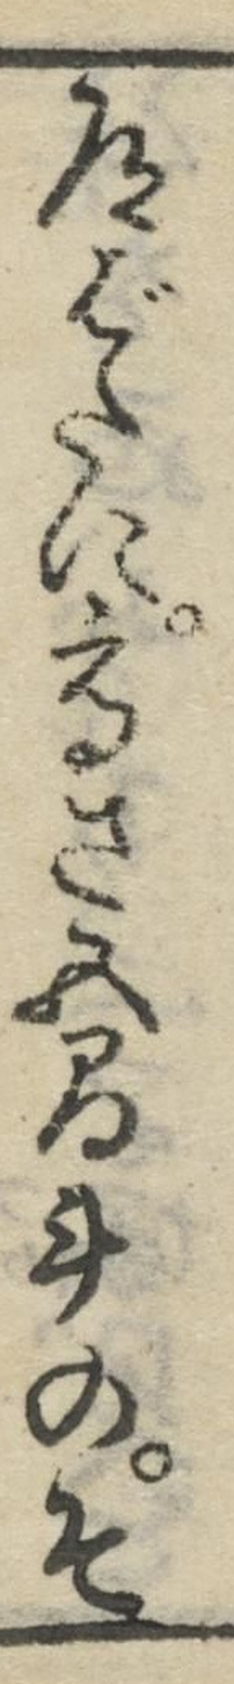道ばたに。高さ五間斗の。そ
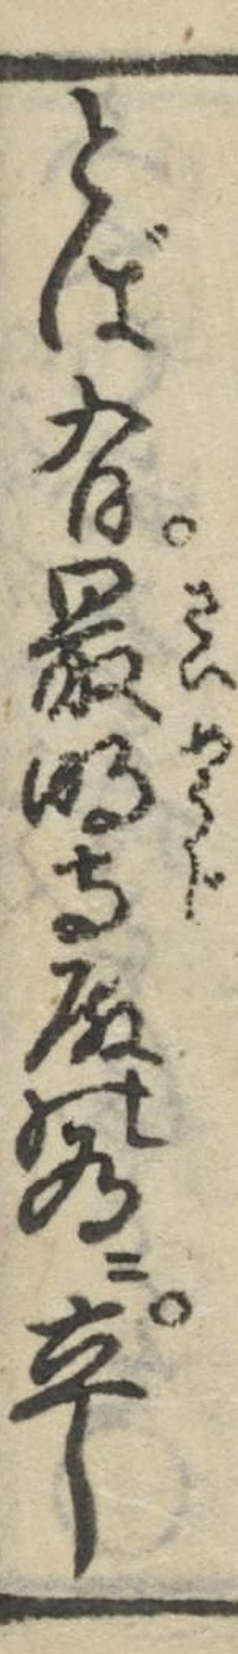とば有。最明寺殿の為に。立し
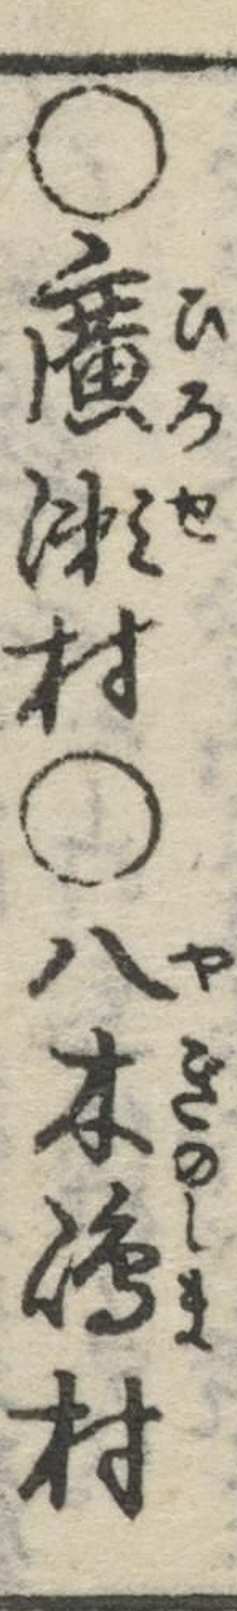〇廣瀬村〇八木嶋村
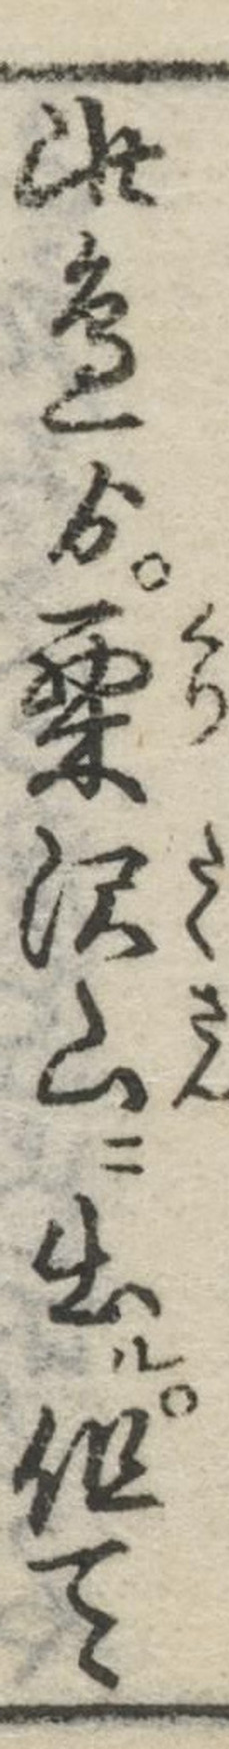此辺ゟ。栗沢山に出る。但て
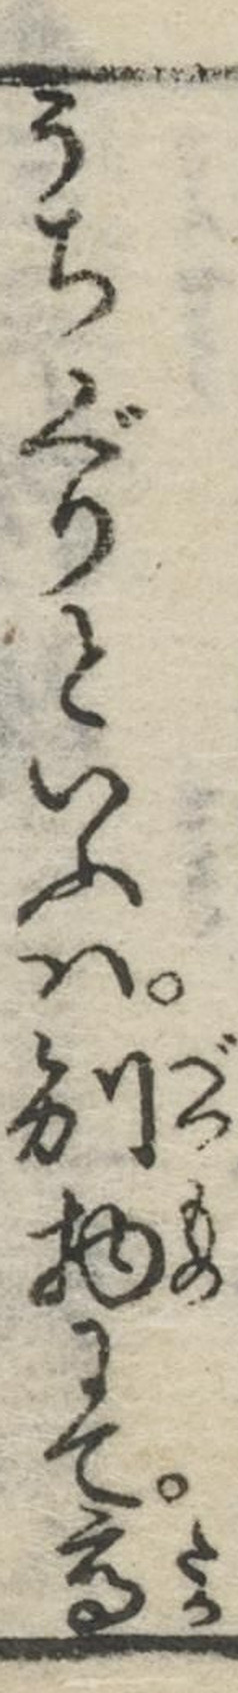うちぐりといふは。別物にて。高
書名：但州城崎浴湯辧
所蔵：東京大学地震研究所図書室 Earthquake Research Institute Library, The University of Tokyo, JAPAN
